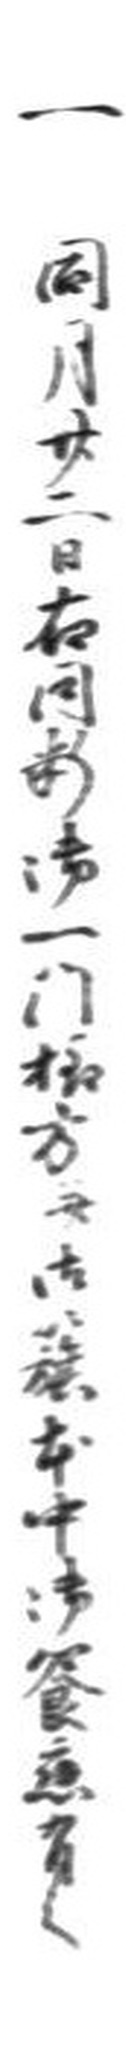一同月廿二日右同断御一門様方幷御簇本中御餐応有之
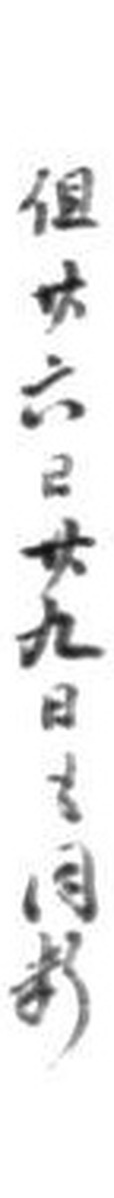但廿六日廿九日も同断
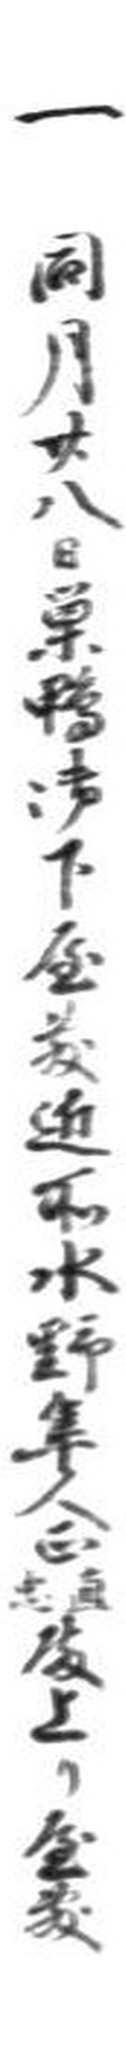一同月廿ハ日巣鴨御下屋敷近所水野隼人正直忠殿上り屋敷
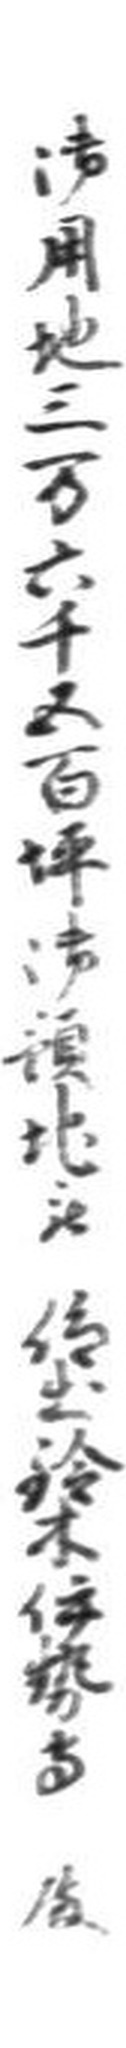御用地三万六千五百坪御領地被仰出鈴木伊勢守殿
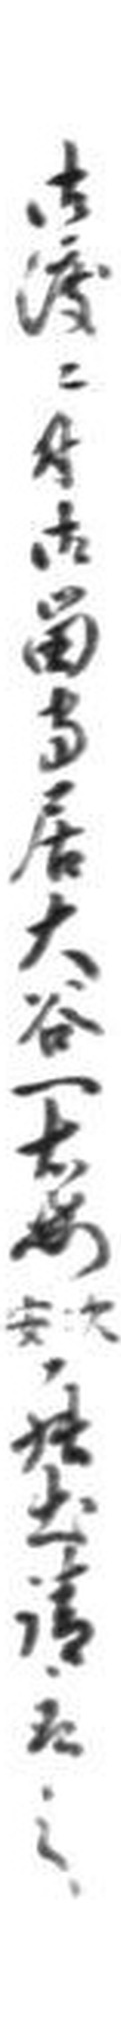御渡ニ付御留守居大谷一右衛門次安罷出請取之
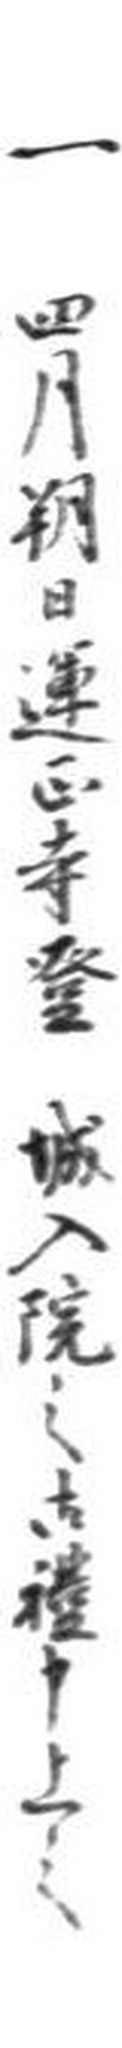一四月朔日運正寺登城入院之御礼申上之

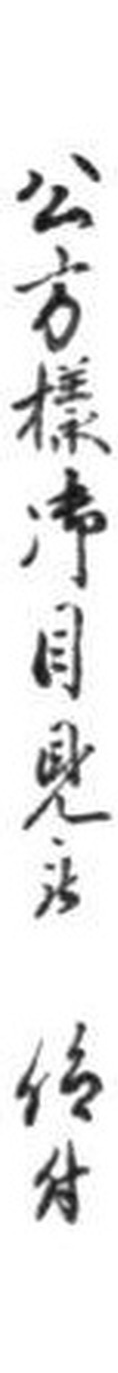公方様御目見被仰付
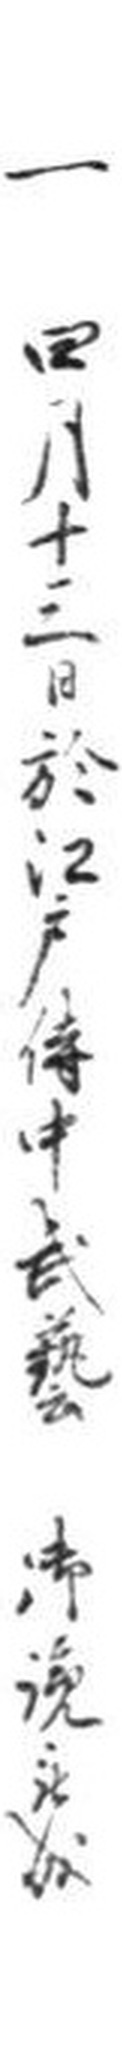一四月十三日於江戸侍中武芸御覧被成
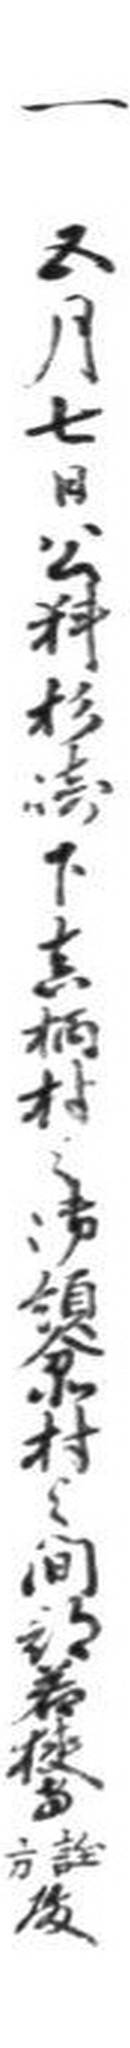一五月七日公領杉崎下真柄村之御領分北村与間部若狭守詮方殿
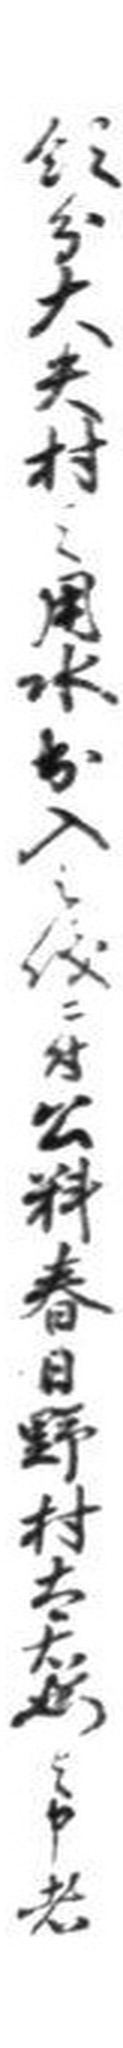領分大夫村之用水出入之儀ニ付公領春日野村太右エ門与申者
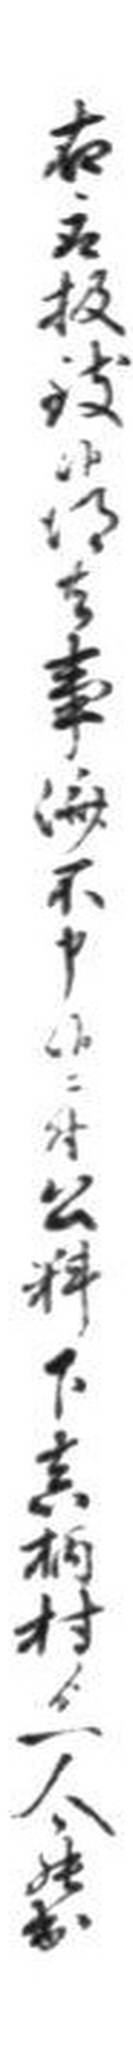右取扱致候得共事済不申候ニ付公領下真柄村ゟ一人罷出
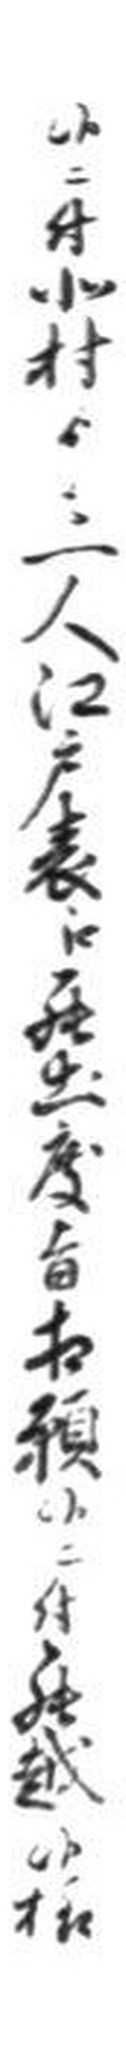候ニ付北村ゟも一人江戸表江罷出度旨相願候ニ付罷越候様
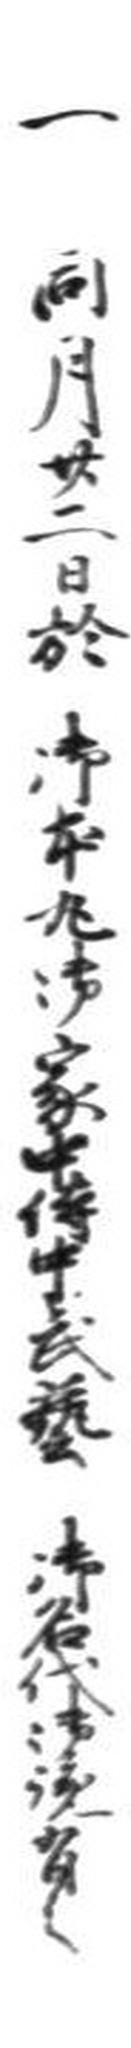一同月廿二日於御本丸御家中侍中武芸御名代御覧有之
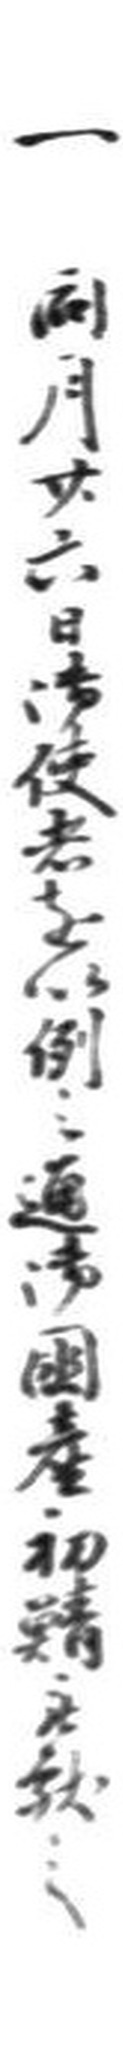一同月廿六日御使者を以例之通御国産初鯖被献之
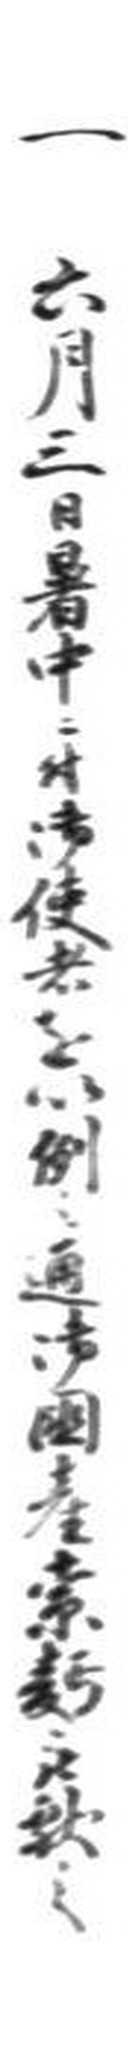一六月三日暑中ニ付御使者を以例之通御国産素麵被献之
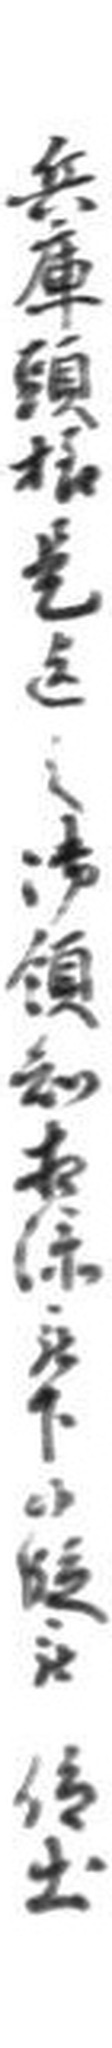兵庫頭様是迄之御領知相添被下候段被仰出
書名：家譜 四十 宗矩公 従享保十一年到享保十二年
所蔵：福井県文書館 Fukui Prefectural Archives
